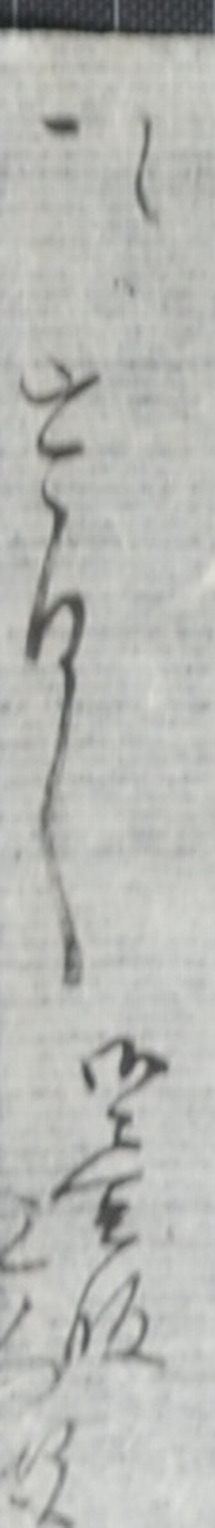一六百文御昼飯
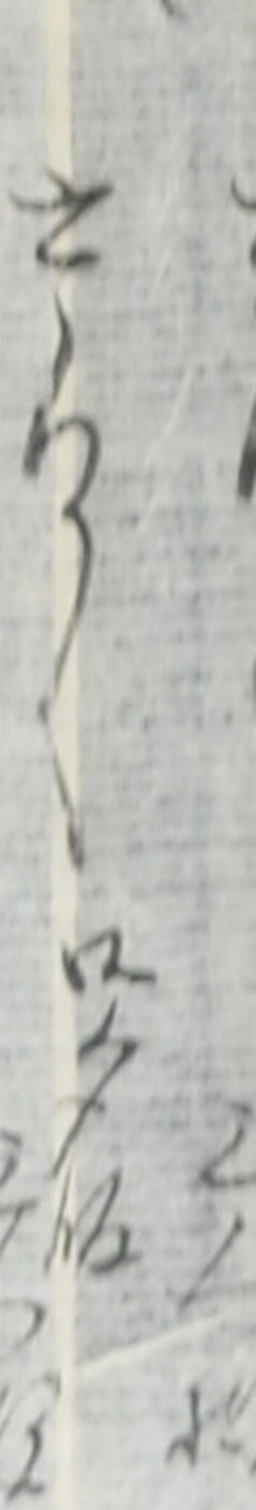一六百文御夕飯
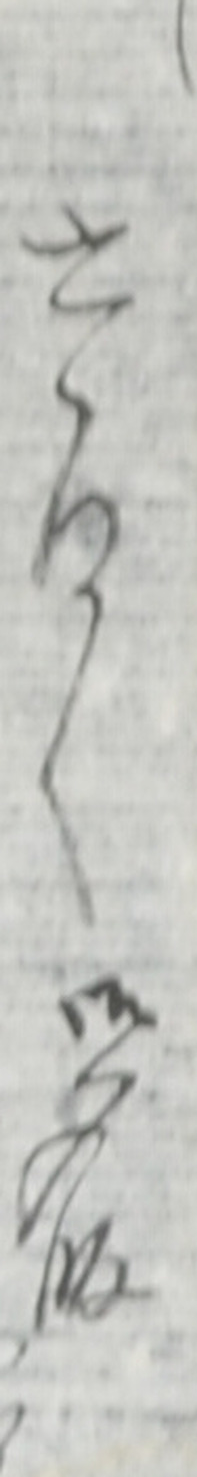一六百文御夕飯
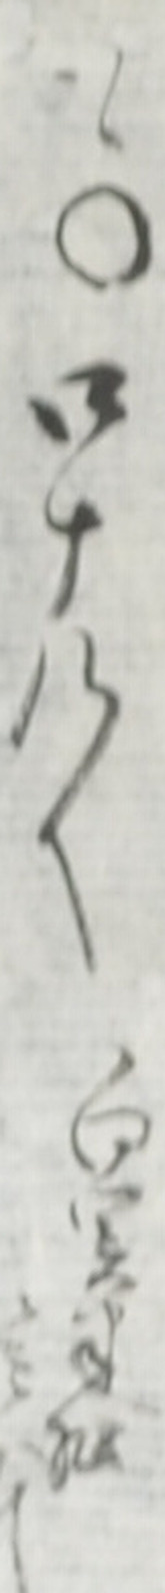一○四十八文魚売番処
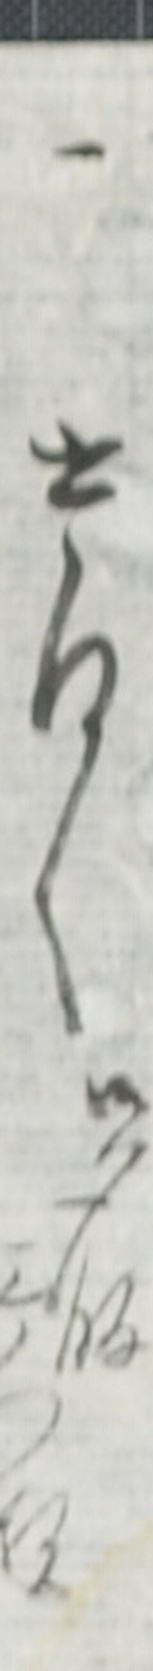一六百文三人様
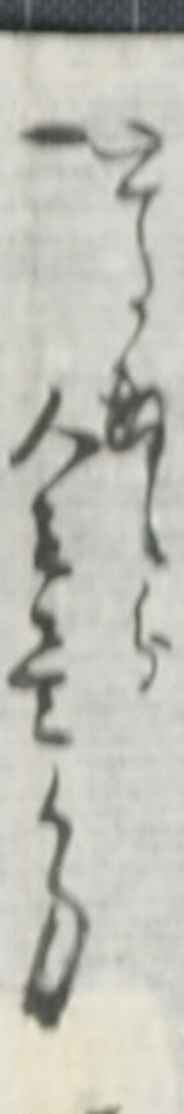〆金壱分
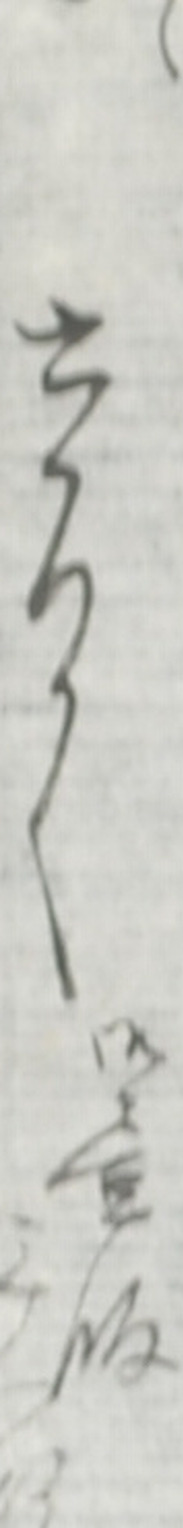一六百文御昼飯
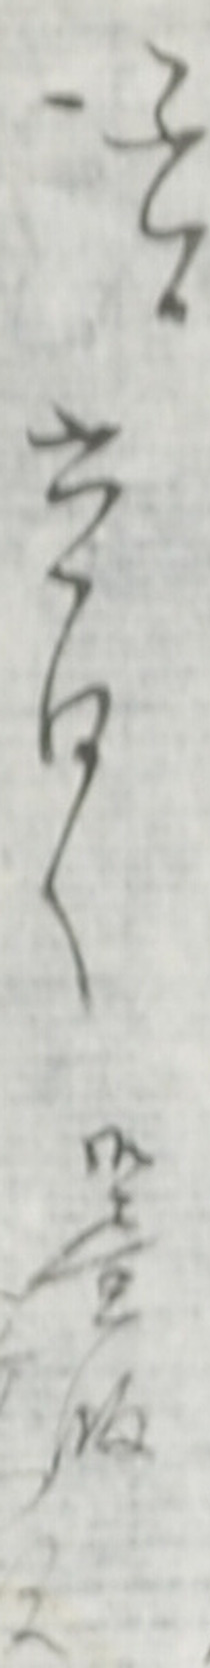一六百文御昼飯
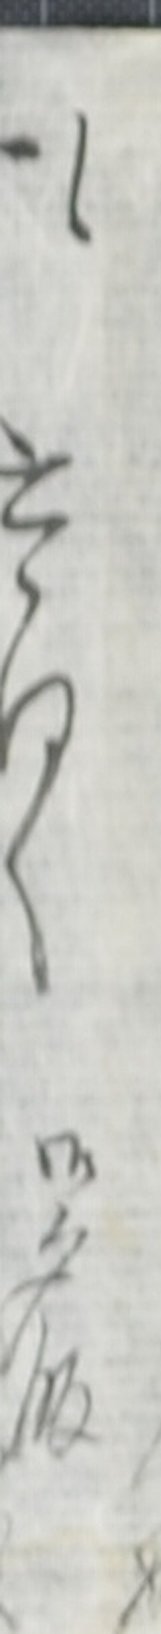一六百文御夕飯
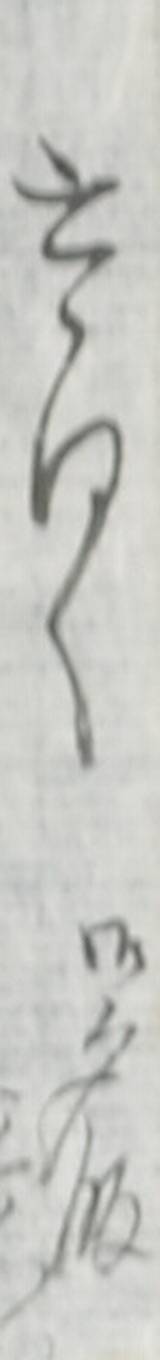一六百文御夕飯
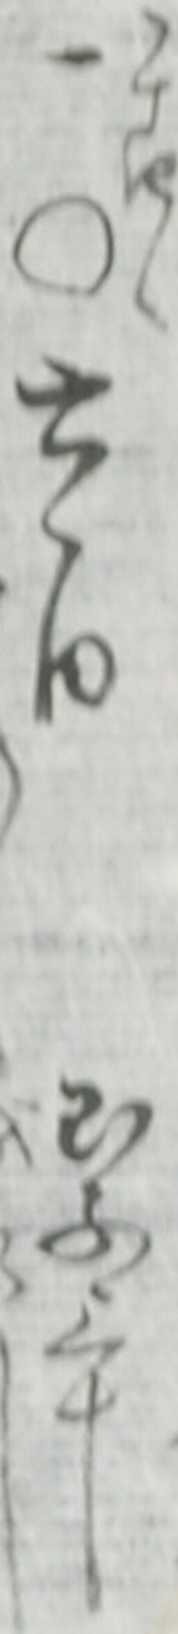一○六百玉子三十
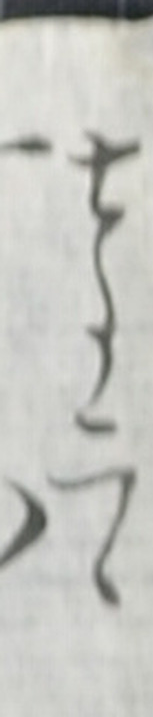七月二日
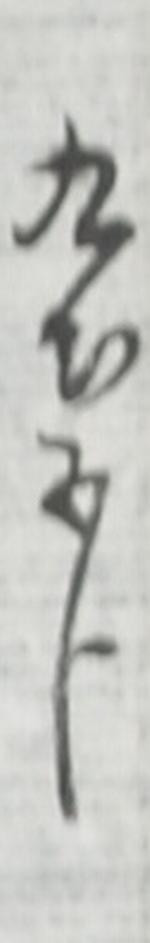九匁五分
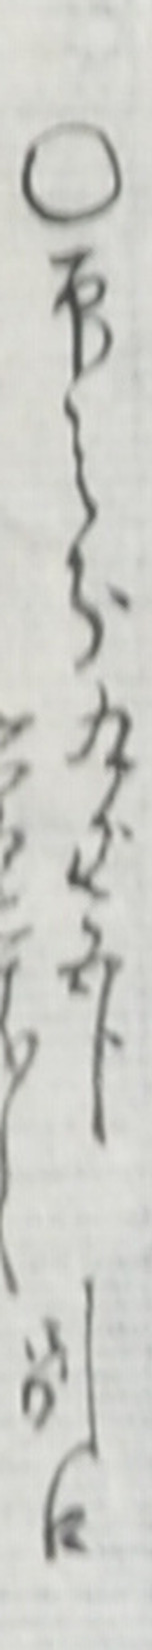○印之分九匁五分
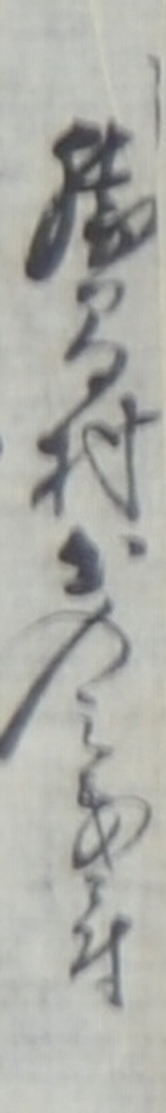勝間村出金義二付
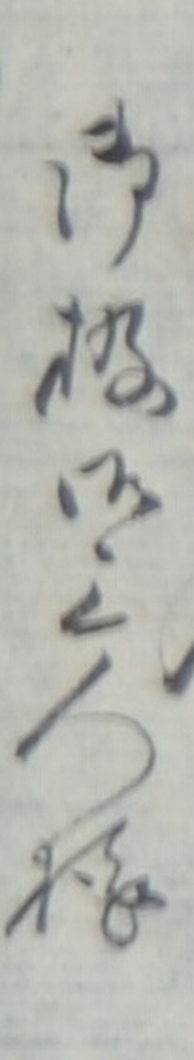御扱御三人様
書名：（金銭書上控）
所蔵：伊那市立高遠町図書館・合同会社AMANE
